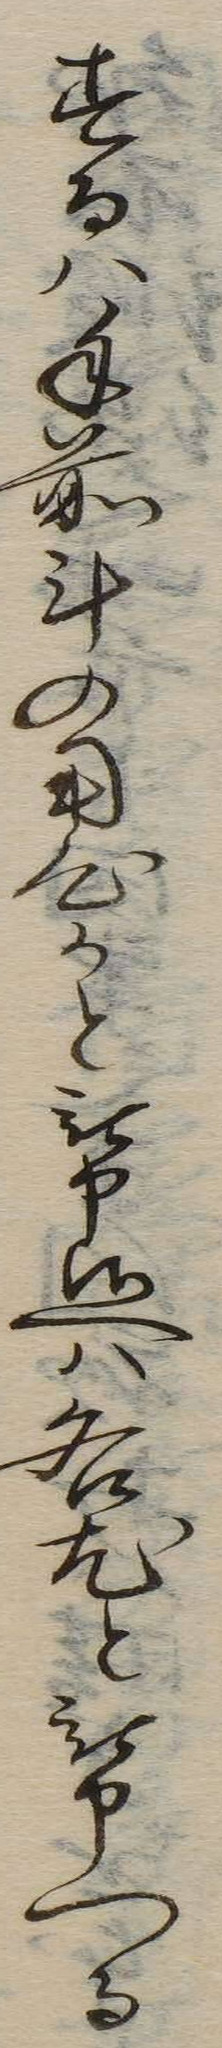するは手前計の用心かと被申候へは各尤と被申つる
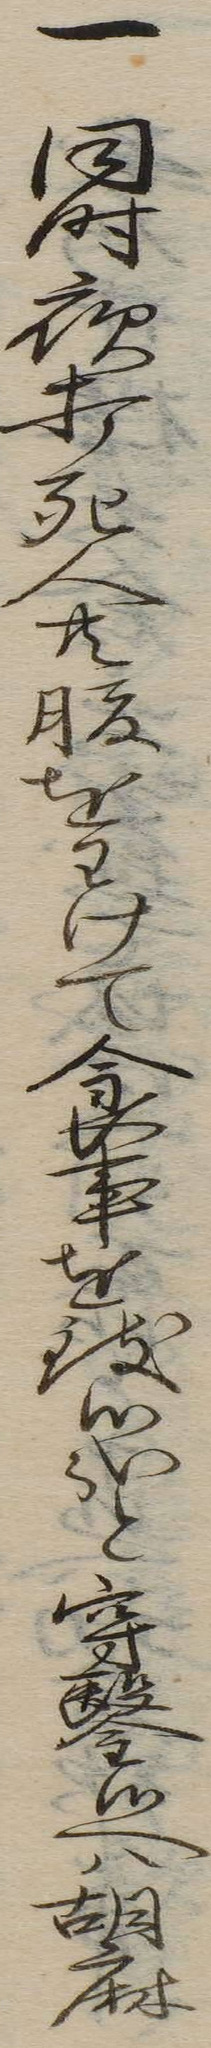一同時夜打死人共腹をわけて食事を致候哉と穿鑿候へは胡麻
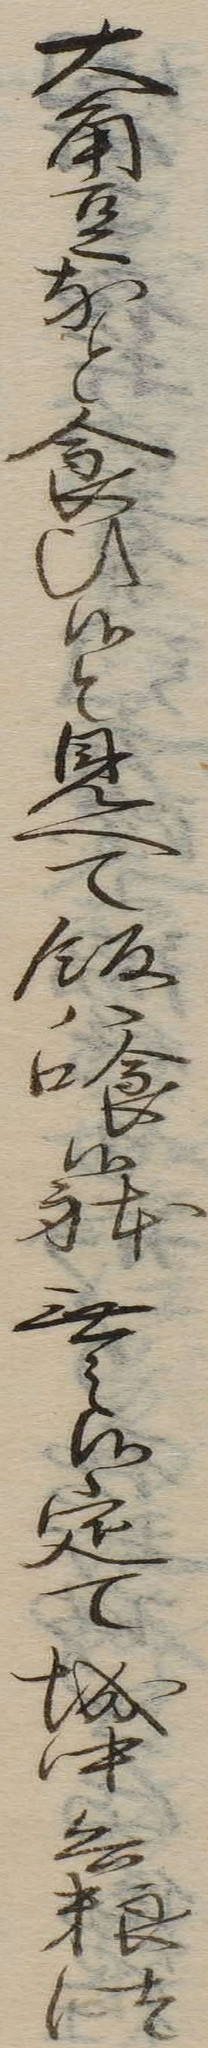大角豆なと食ひ候と見へて飯は喰候体無之候定て城中兵糧つ
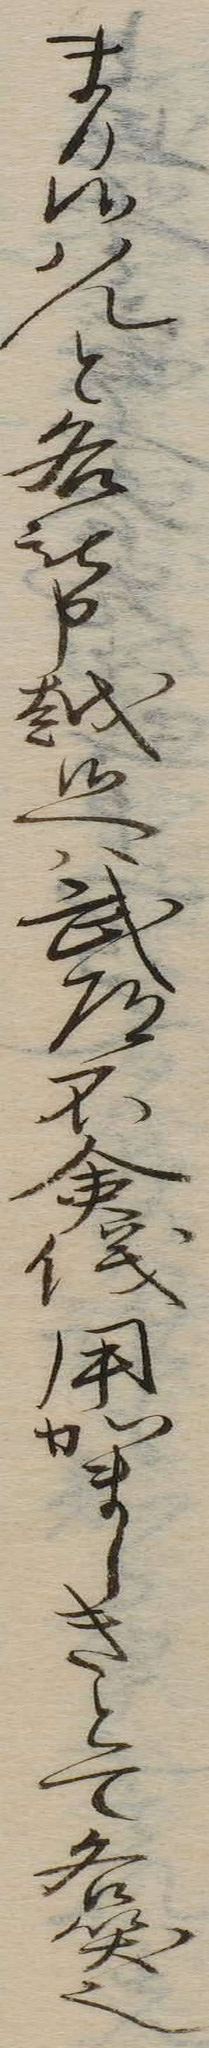まり候はんと各被申越候へは武道不僉儀用かましきとて各笑也
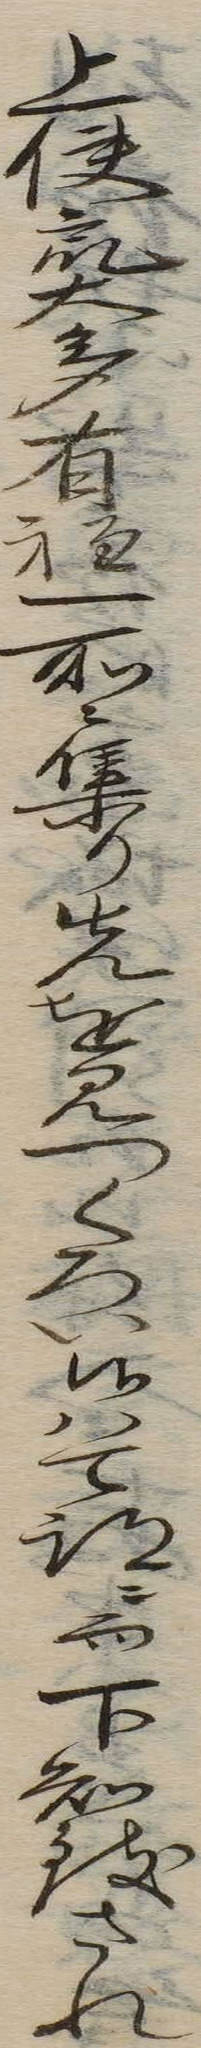一上使衆大多有程一所ニ集り先を見つくろい候はて跡ニ而下知致され
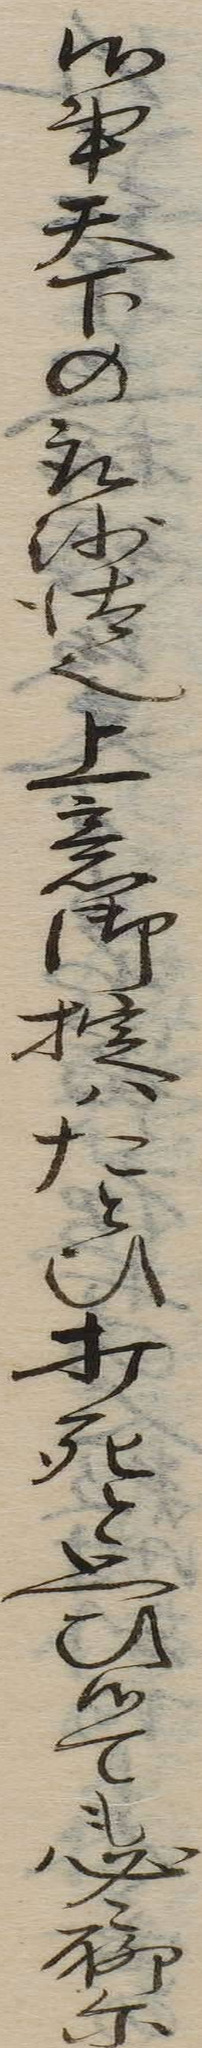候事天下の取沙汰也上意御掟はたとひ打死と思ひ候ても必々聊爾
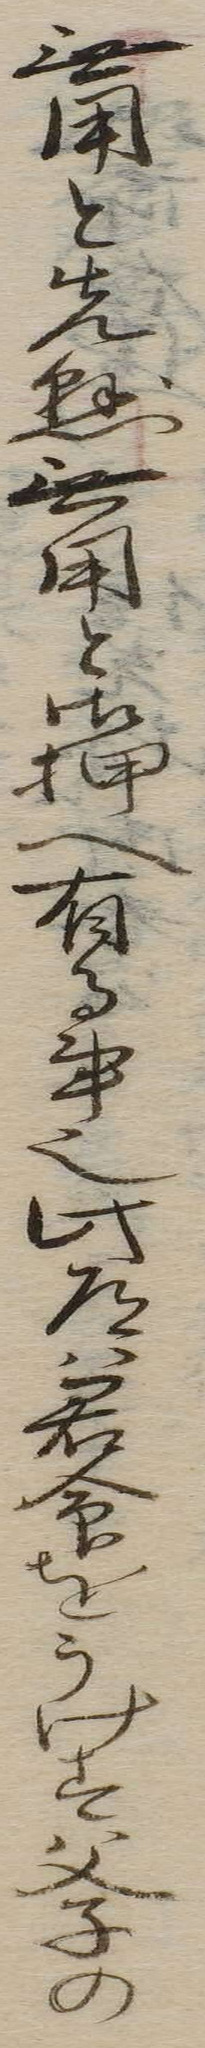無用と先懸無用と御押へ有る事也此道は君命をうけす父子の
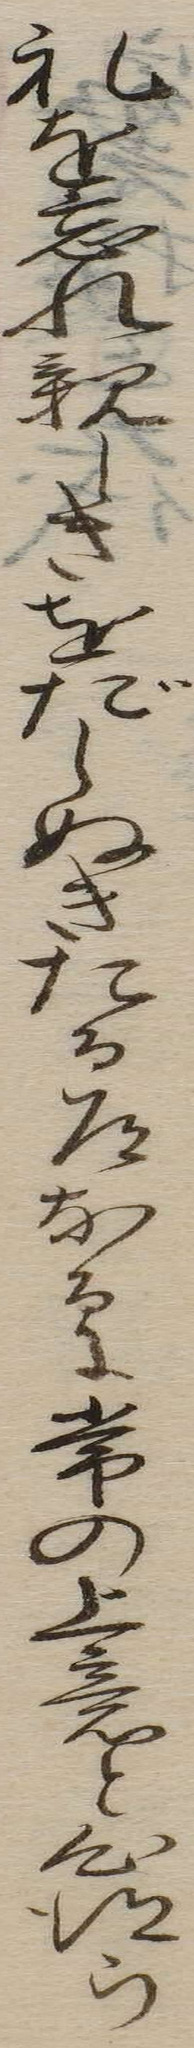礼を忘れ親しきをだしぬきたる道なるに常の上意と心得ら
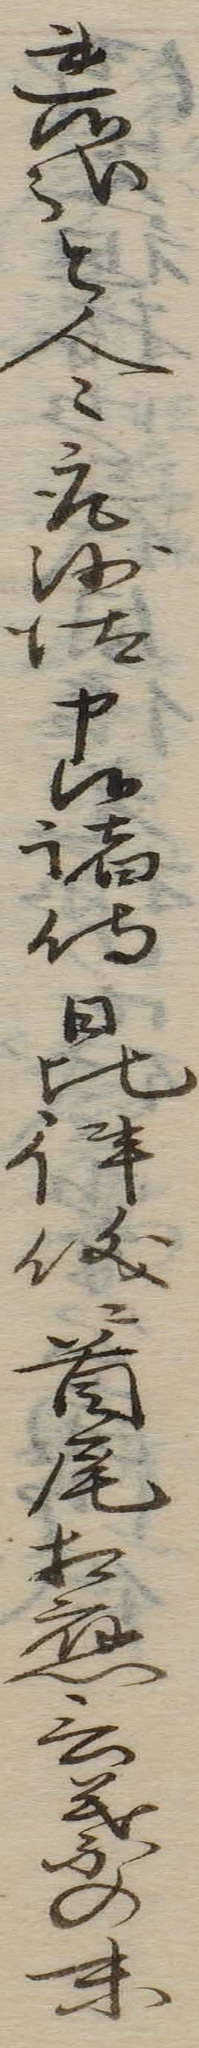れ候哉と人々取沙汰申候諸侍日頃律儀ニ首尾相応言葉の末
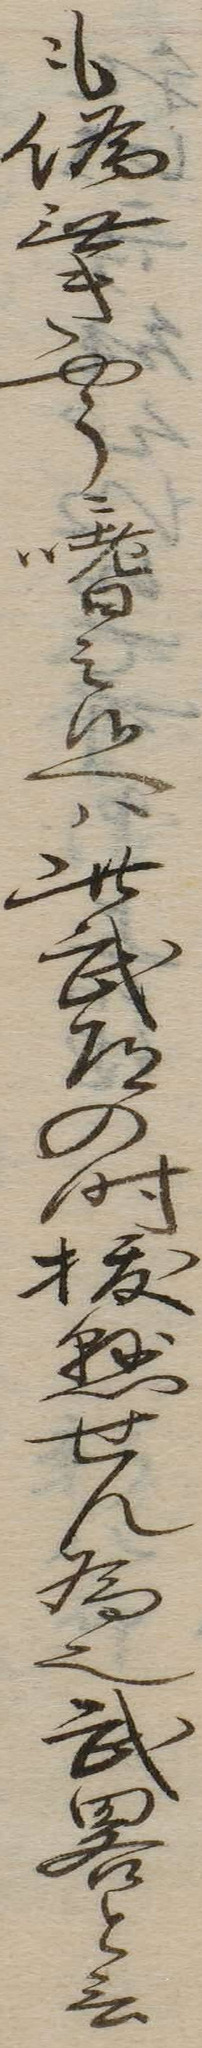も偽無きやうニ嗜み候へは此武道の時抜懸せん為也武略と言
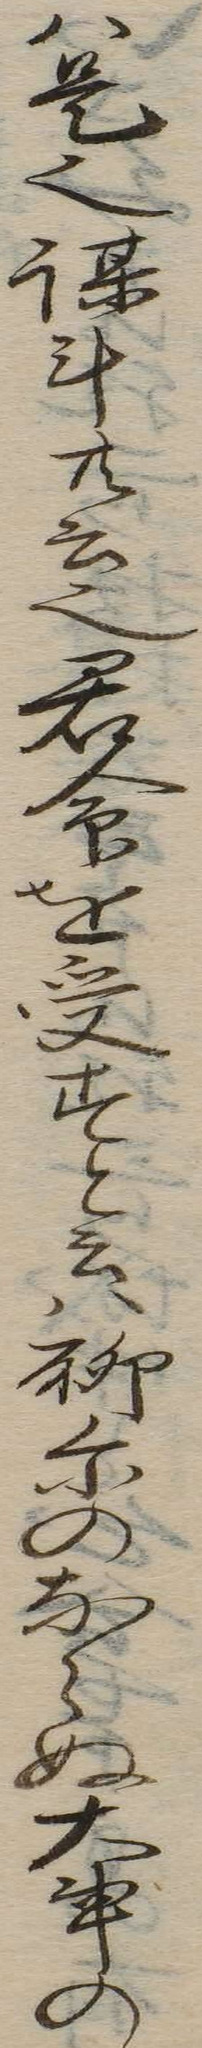は是也謀計共云也君命を受けすと云は聊爾のならぬ大事の
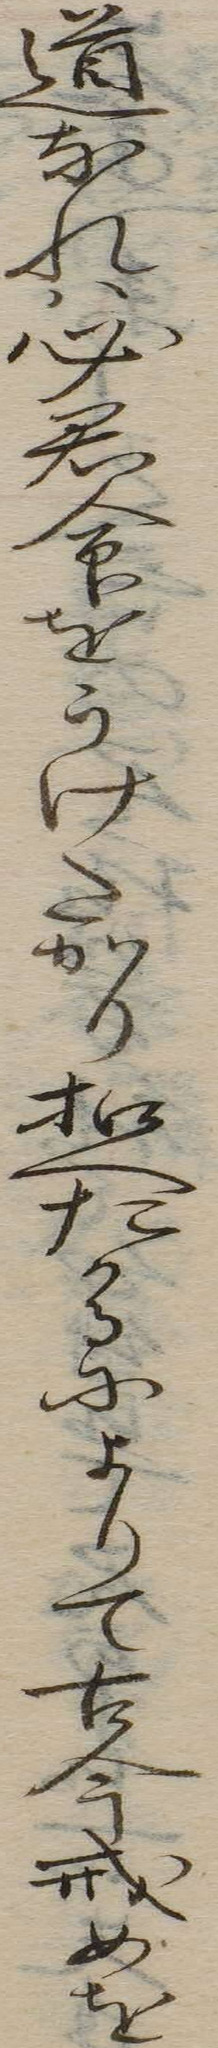道なれは必君命をうけたかり控へたかるによりて古今戒めを
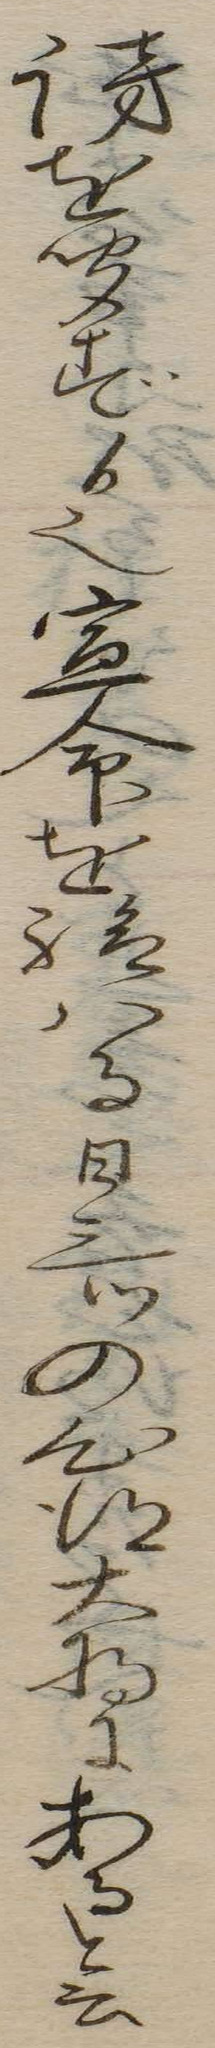謗を聞ず候也宣命を給はる日三ツの心得大将にあると云
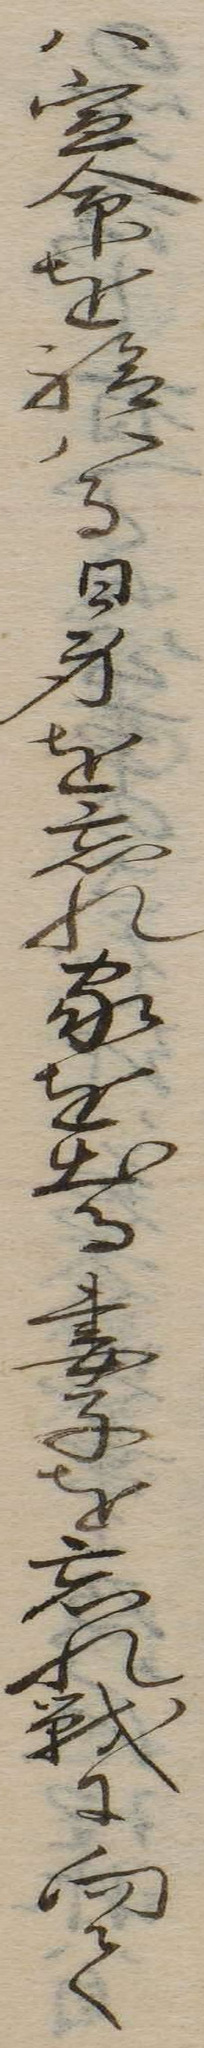は宣命を給はる日身を忘れ家を出る妻子を忘れ戦に向て
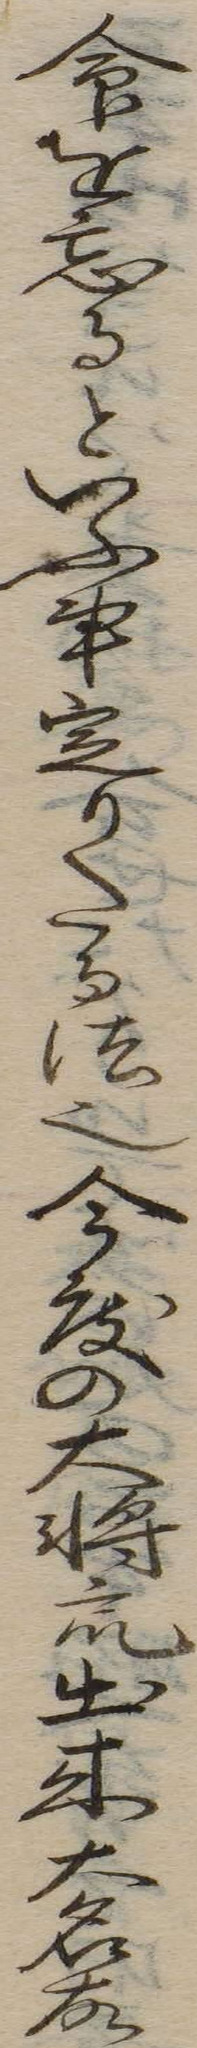命を忘るといふ事定りたる法也今度の大将衆出来大名故
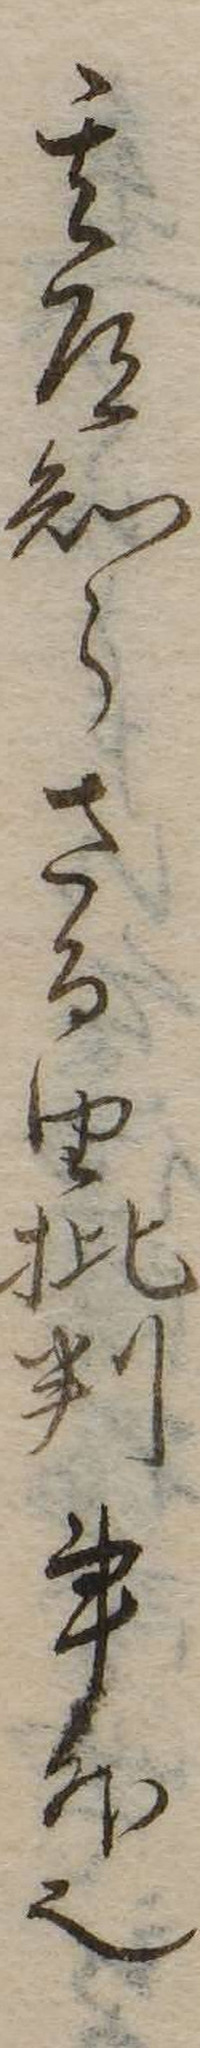其道知らさる由批判事外也
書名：三河之物語
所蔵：国文学研究資料館
